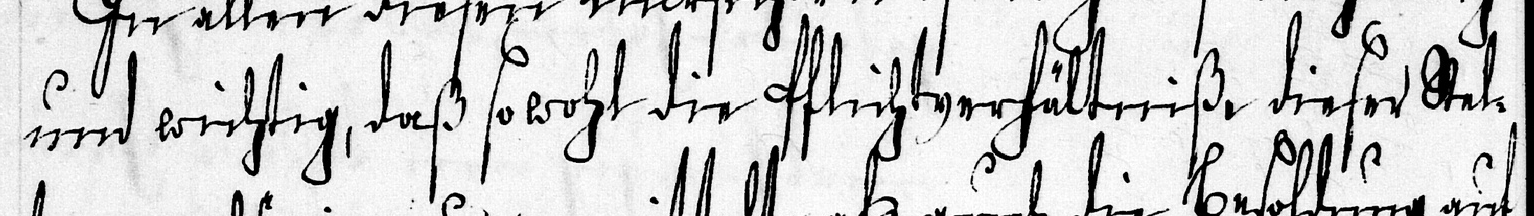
und wichtig, daß sowohl die Pflichtverhältniße dieser Ste¬
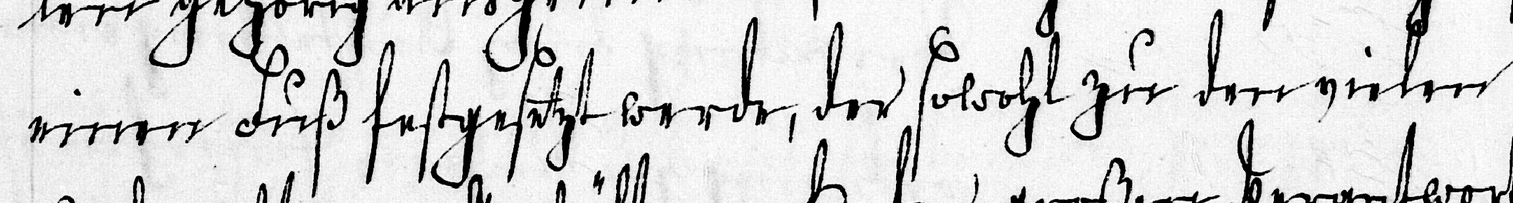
einen Fuß festgesetzt werde, der sowohl zu den vielen
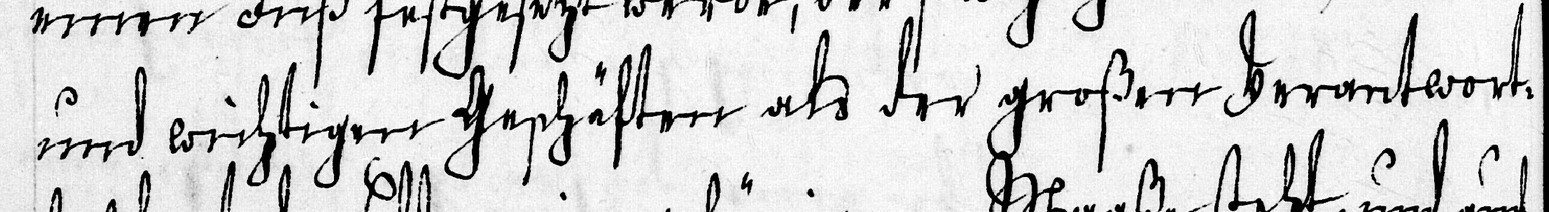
und wichtigen Geschäften als der großen Verantwort¬
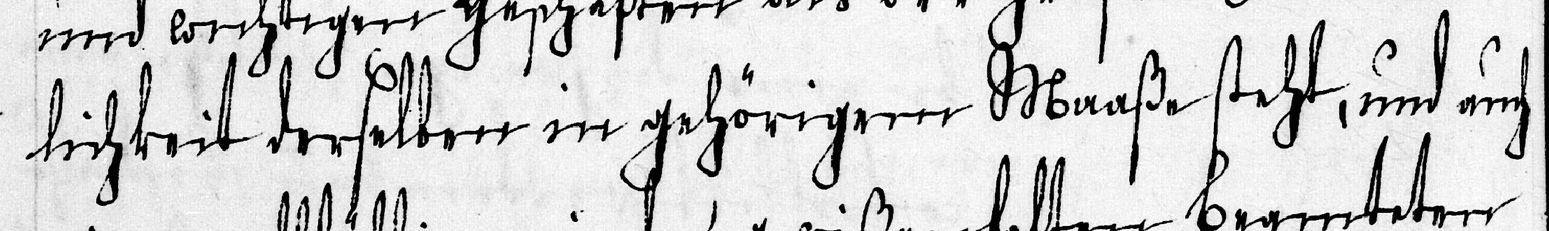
lichkeit derselben in gehörigem Maaße steht, und auch
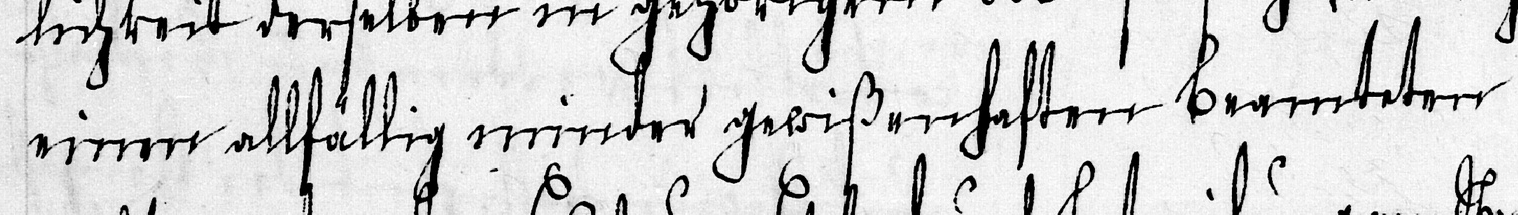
einen allfällig minder gewißenhaften Beamteten
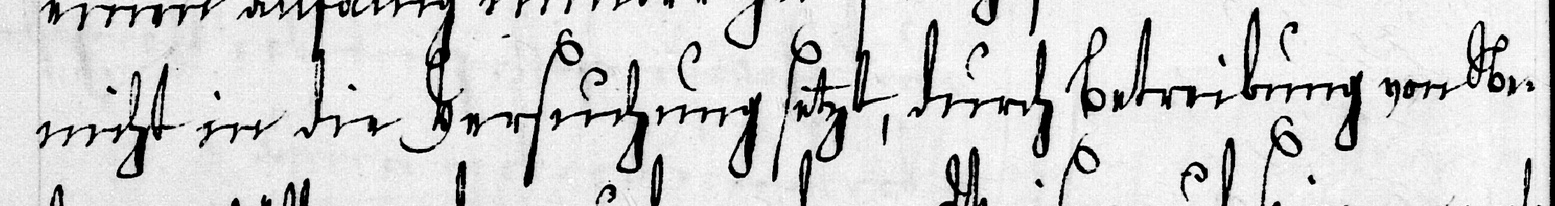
nicht in die Versuchung setzt, durch Betreibung von Ne¬
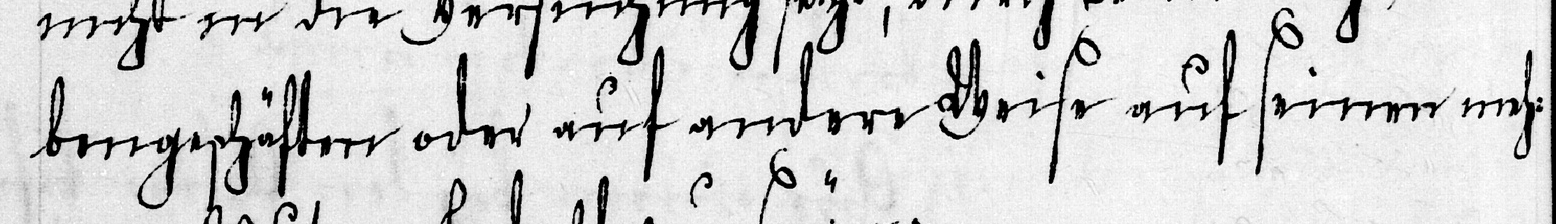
bengeschäften oder auf andere Weise auf seinen meh¬
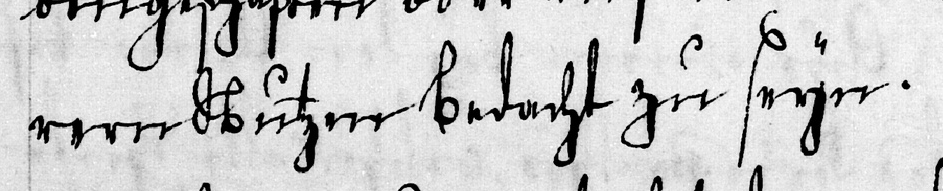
rern Nutzen bedacht zu seyn.
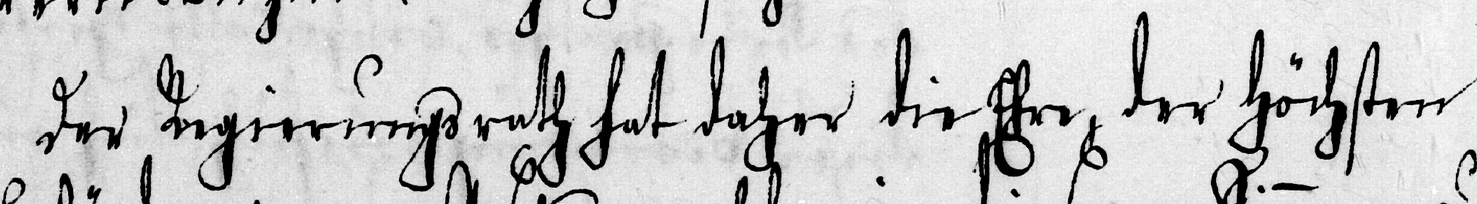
Der Regierungsrath hat daher die Ehre, der Höchsten
